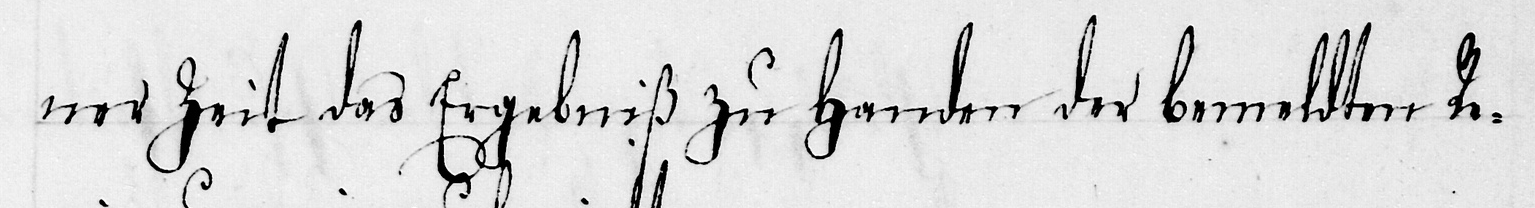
ner Zeit das Ergebniß zu Handen der bemeldten Re¬
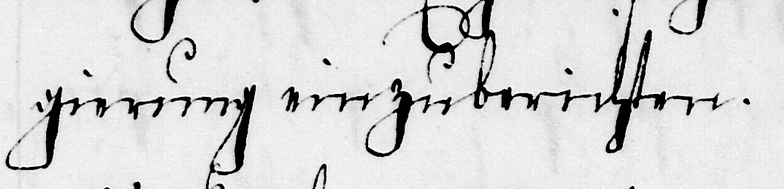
gierung einzuberichten.
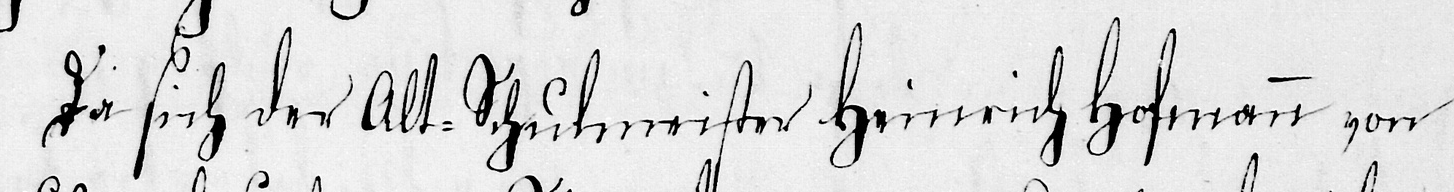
Da sich der Alt-Schulmeister Heinrich Hofmann von
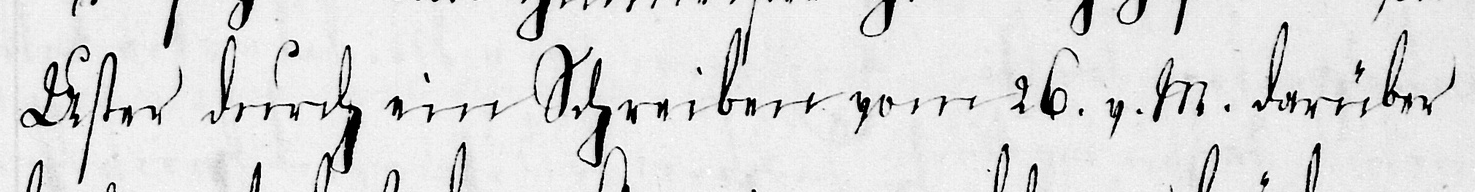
Uster durch ein Schreiben vom 26. v. M. darüber
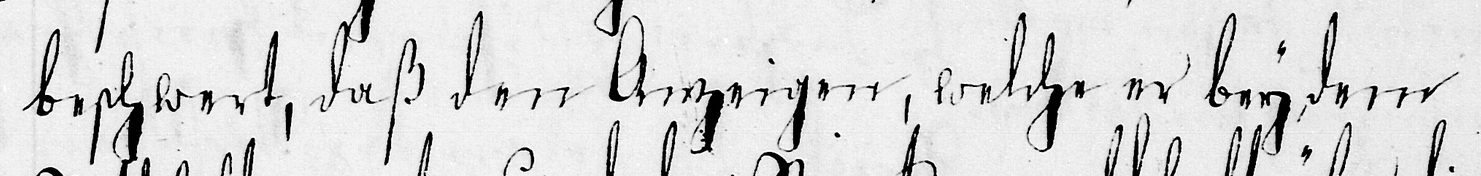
beschwert, daß den Anzeigen, welche er bey dem
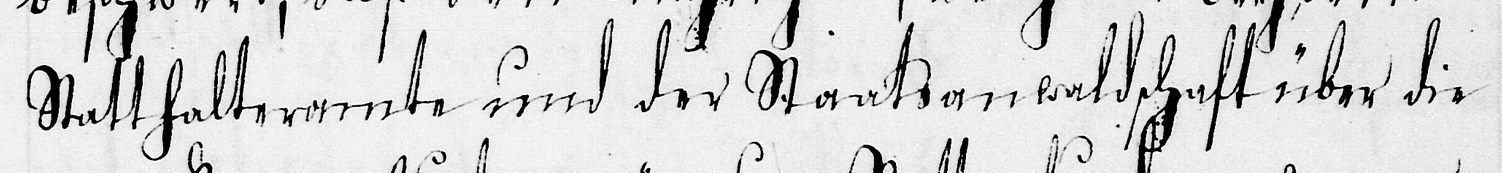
Statthalteramte und der Staatsanwaldschaft über die
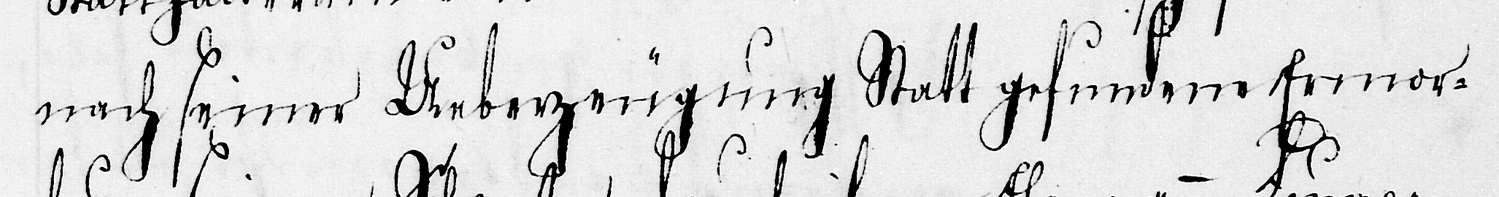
nach seiner Ueberzeugung Statt gefundene Ermor¬
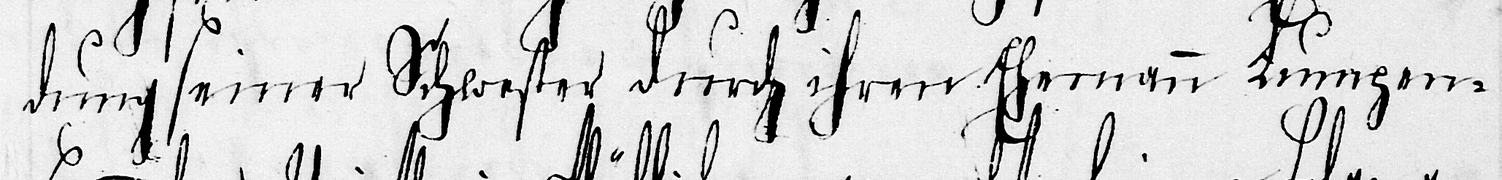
dung seiner Schwester durch ihren Ehemann Lumpen¬
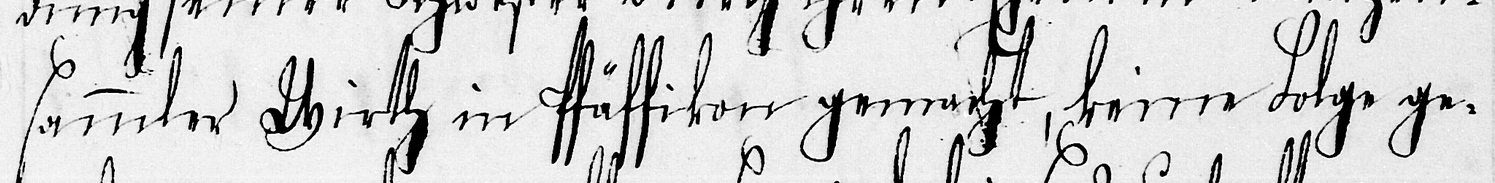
sammler Wirth in Pfäffikon gemacht, keine Folge ge¬
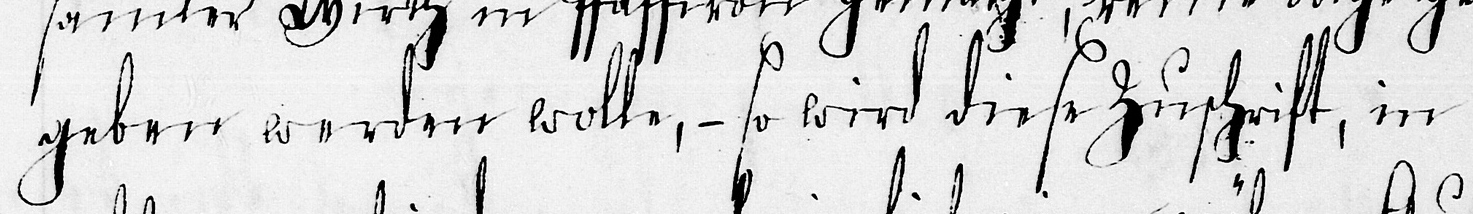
geben werden wolle, – so wird diese Zuschrift, in
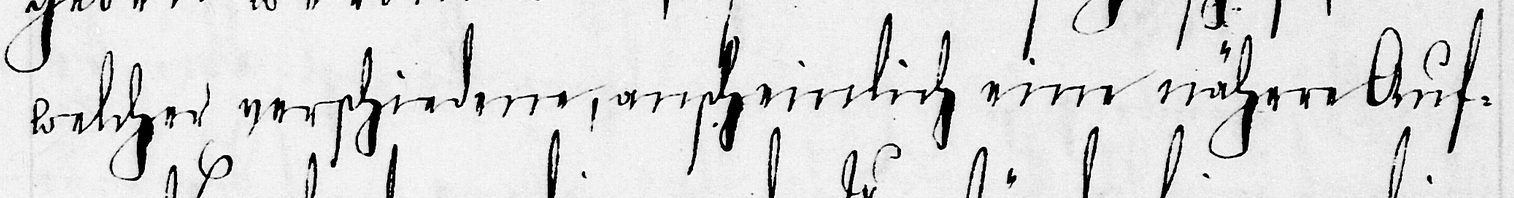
welcher verschiedene, anscheinlich eine nähere Auf¬
